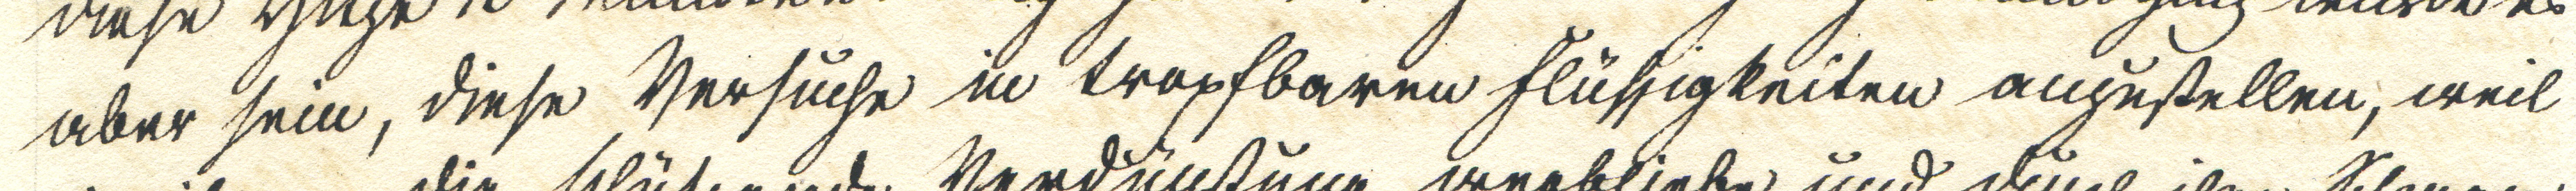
aber sein, diese Versuche in tropfbaren Flüssigkeiten anzustellen, weil
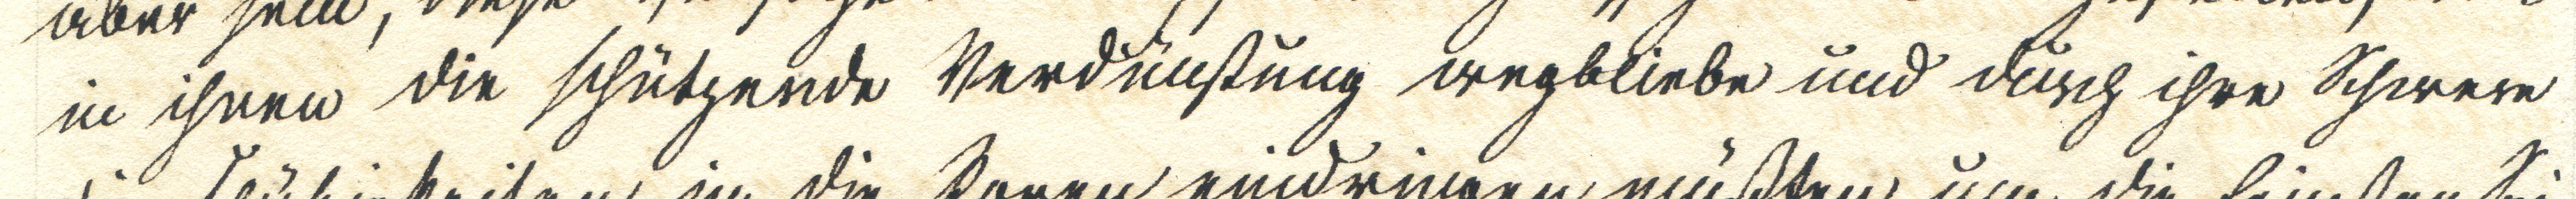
in ihnen die schützende Verdünstung wegbliebe und durch ihre Schwere
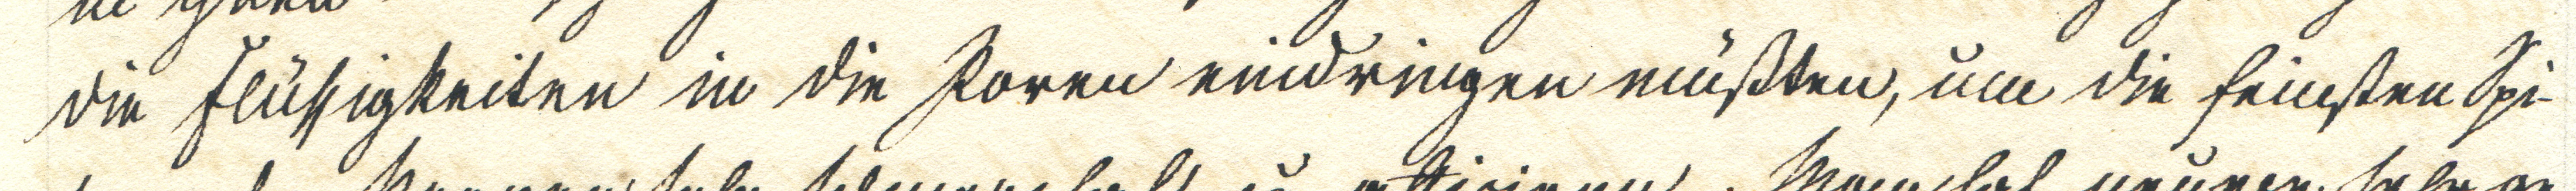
die Flüssigkeiten in die Poren eindringen müßten, um die feinsten Spi-
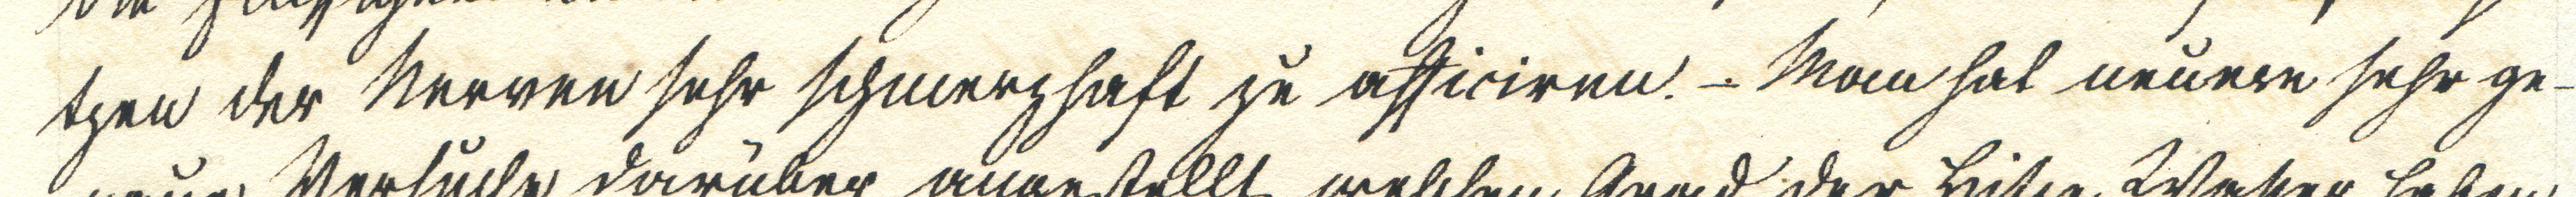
tzen der Nerven sehr schmerzhaft zu afficiren. – Man hat neuere sehr ge-
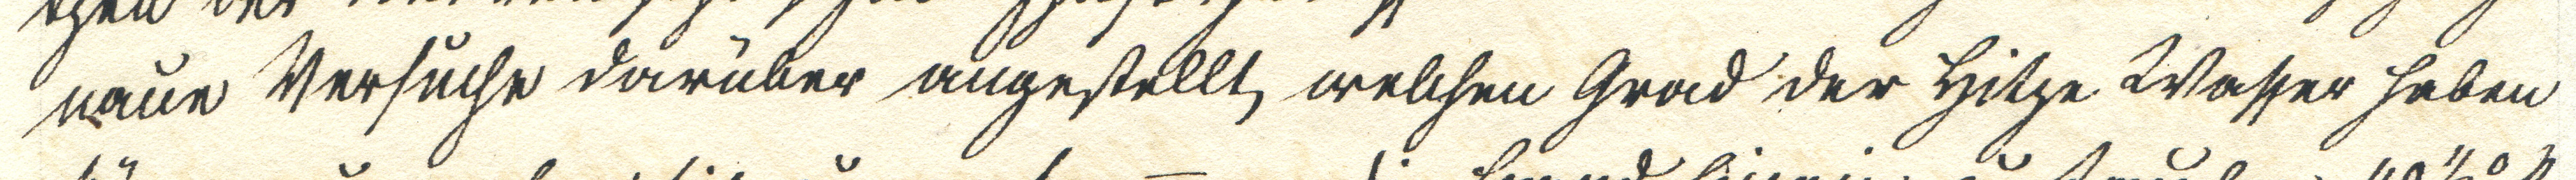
naue Versuche darüber angestellt, welchen Grad der Hitze Wasser haben
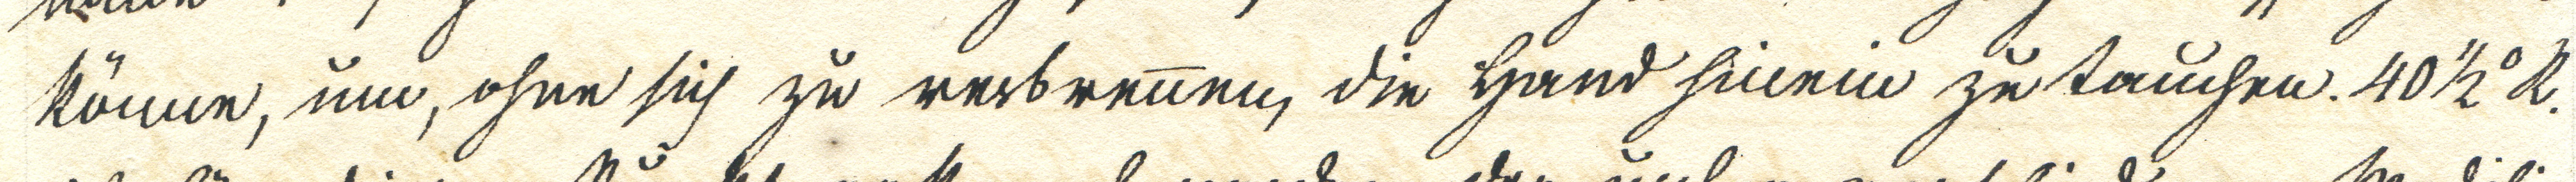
könne, um, ohne sich zu verbreñen, die Hand hinein zu tauchen. 40½° R.
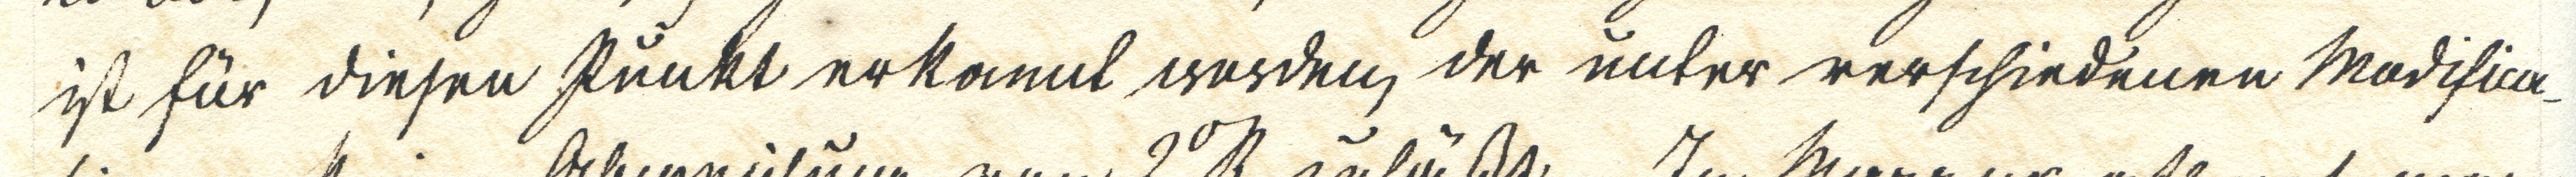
ist für diesen Punkt erkannt worden, der unter verschiedenen Modifica-
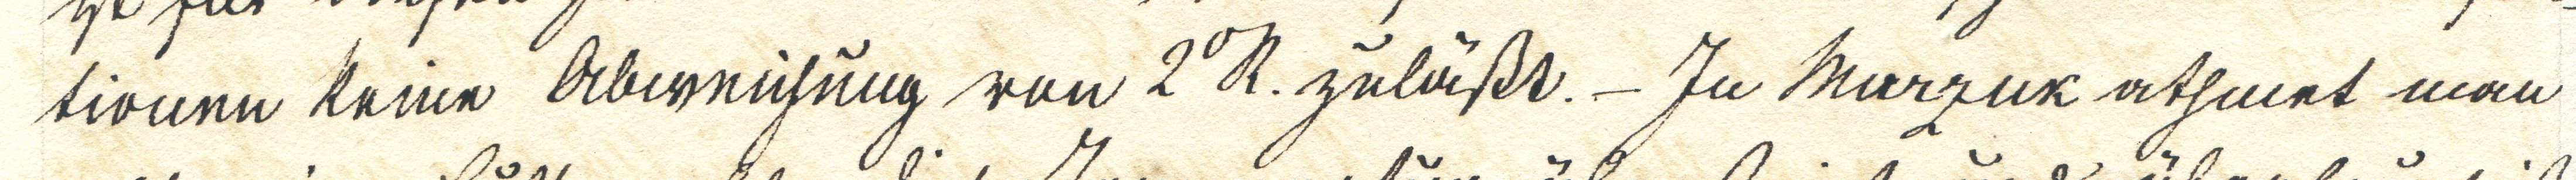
tionen keine Abweichung von 2° R. zuläßt. – In Murzuk athmet man
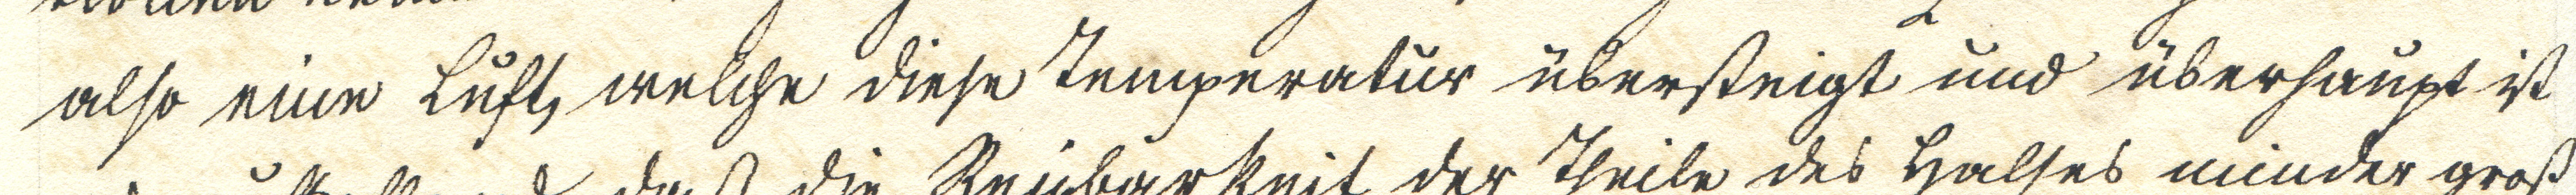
also eine Luft, welche diese Temperatur übersteigt und überhaupt ist
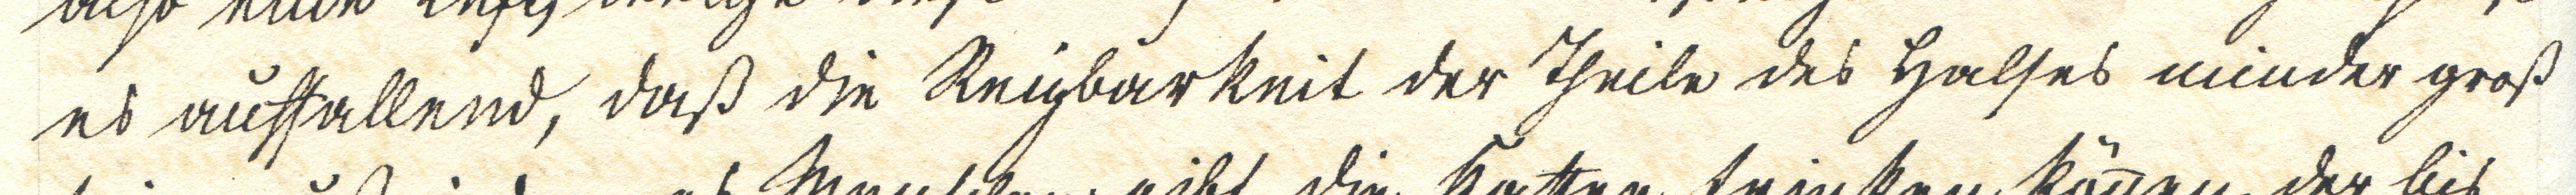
es auffallend, daß die Reizbarkeit der Theile des Halses minder groß
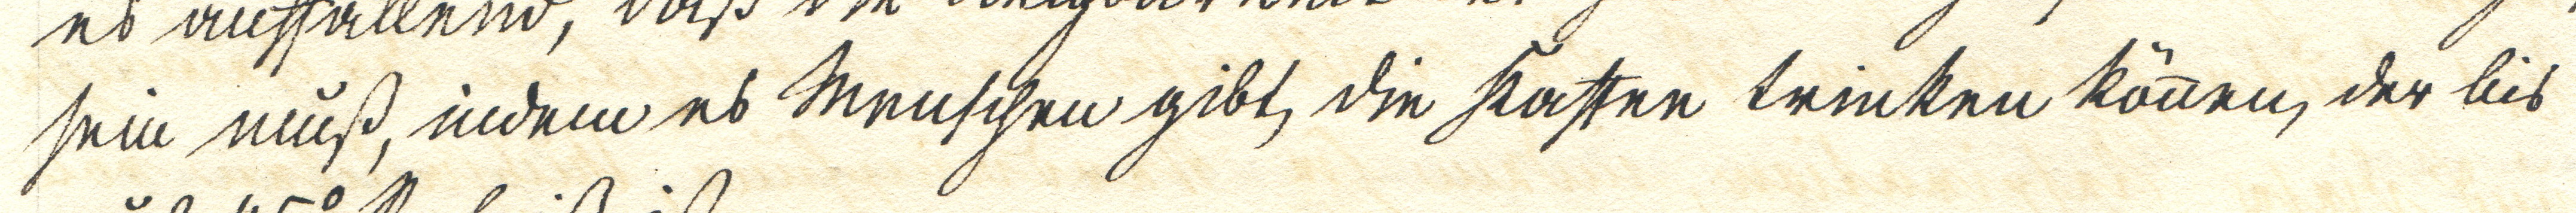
sein muß, indem es Menschen gibt, die Kaffee trinken köñen, der bis
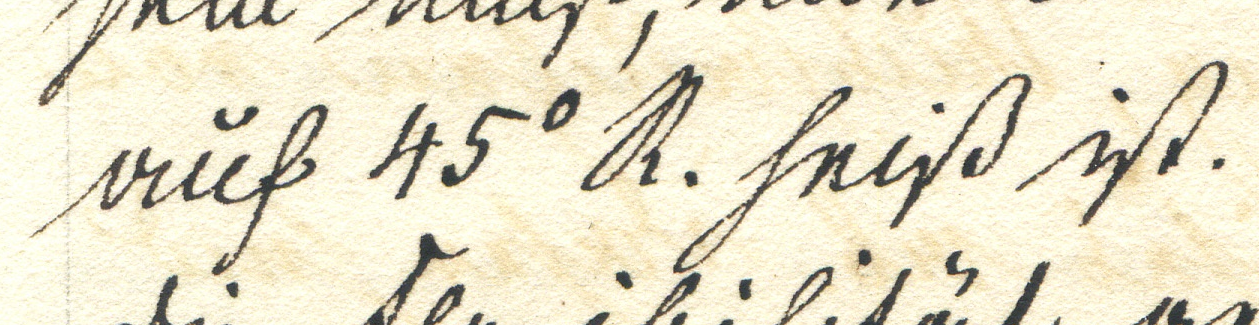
auf 45° R. heiß ist.
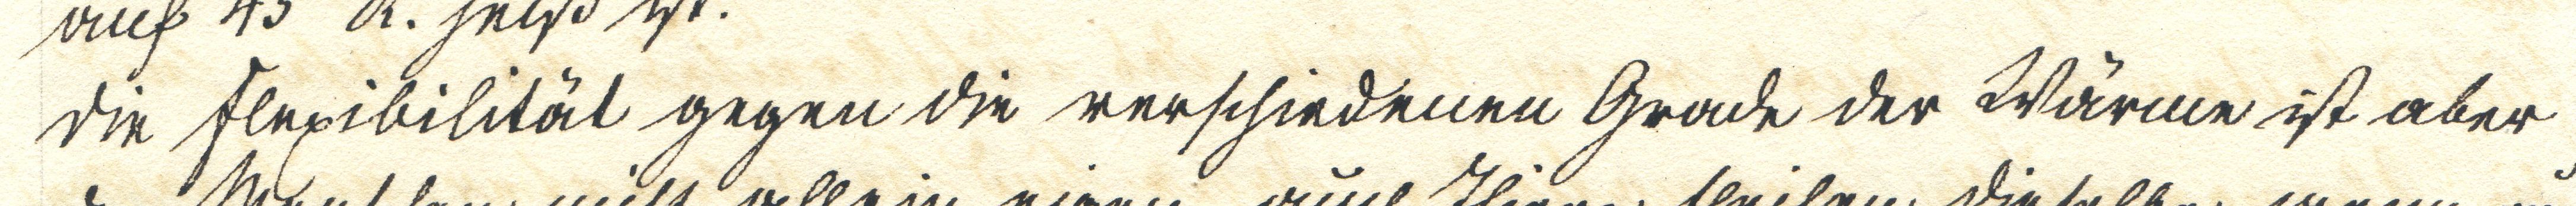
Die Flexibilität gegen die verschiedenen Grade der Wärme ist aber
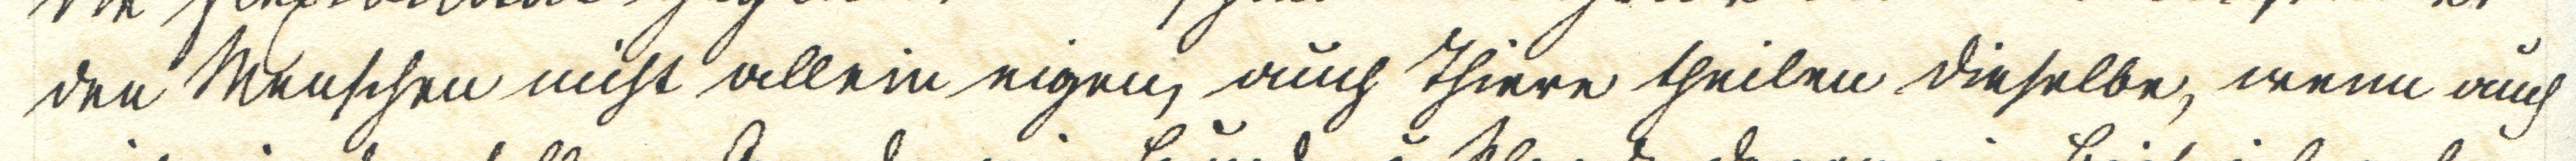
den Menschen nicht allein eigen, auch Thiere theilen dieselbe, wenn auch
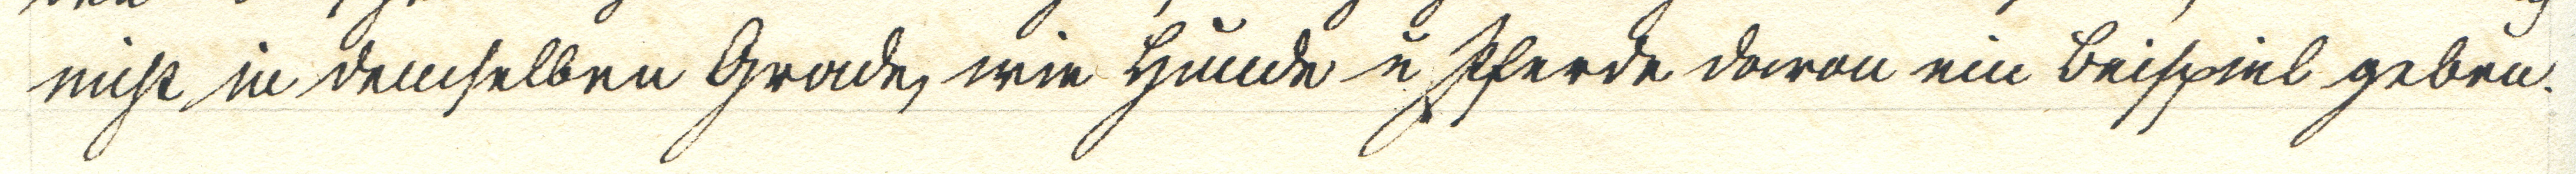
nicht in demselben Grade, wie Hunde u Pferde davon ein Beispiel geben.
